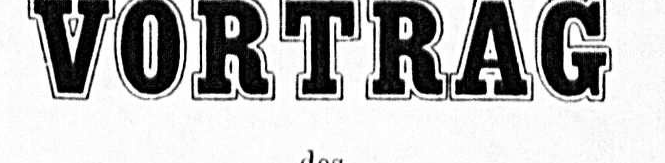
VORTRAG
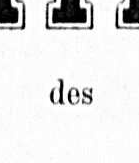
des
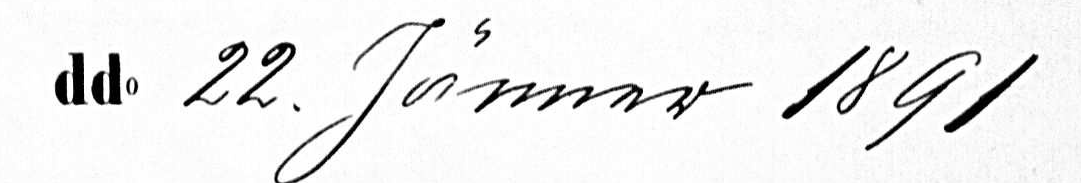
Ddo 22 Jänner 1891
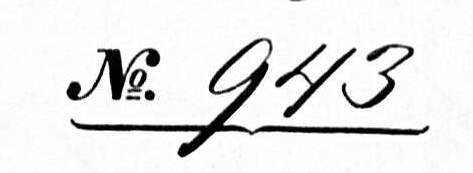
No 943
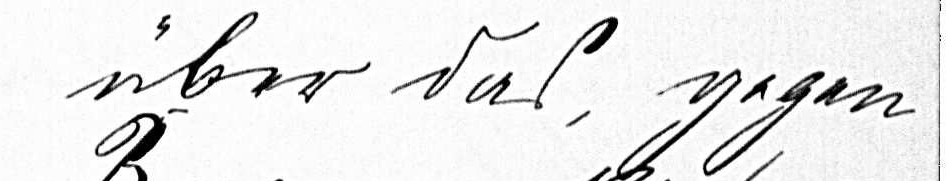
über das gegen
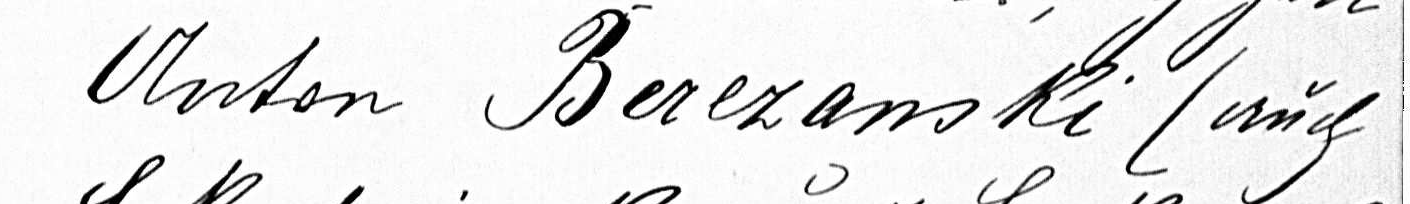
Anton Berezanski (auch
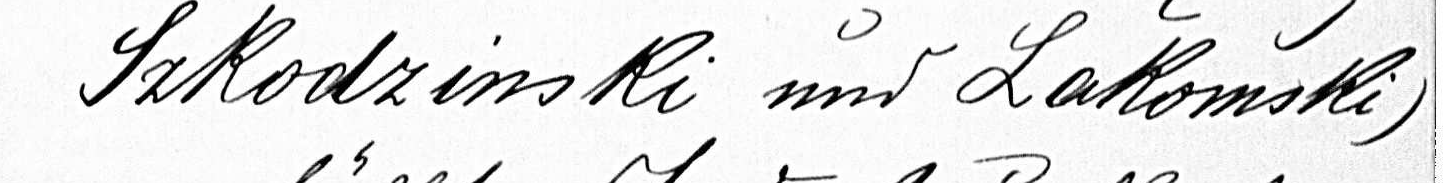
Szkodzinski und Lakomski)
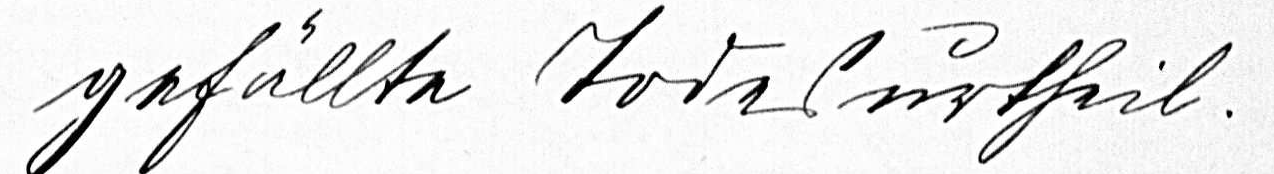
gefällte Todesurtheil.
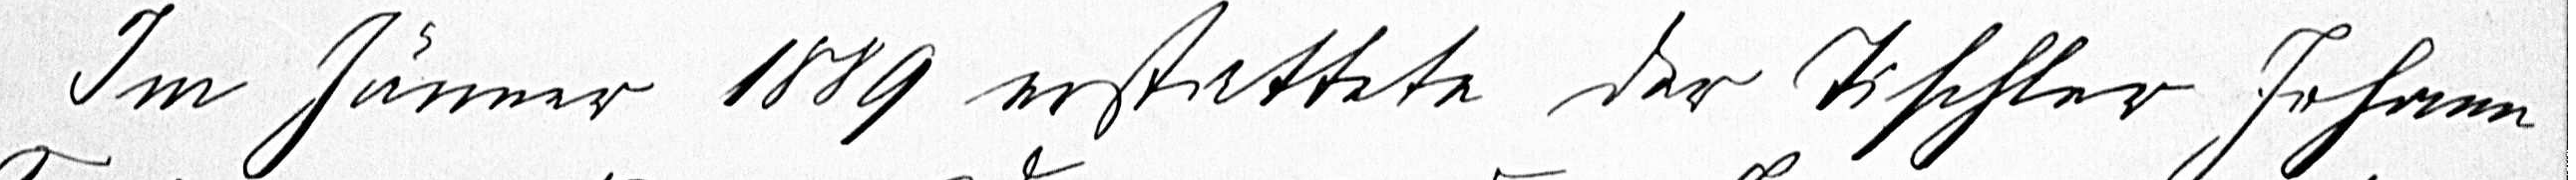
Im Jänner 1889 erstattete der Tischler Johann
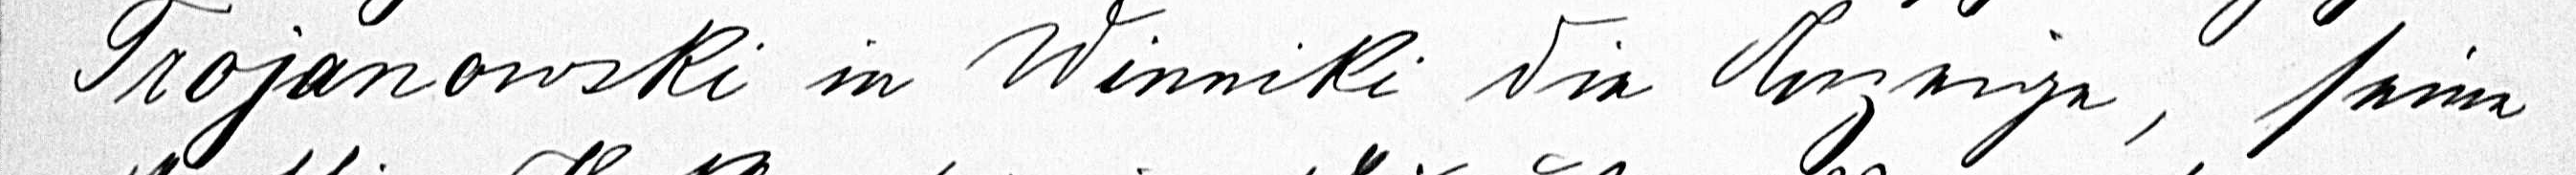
Trojanowski in Winniki die Angzeige, seine
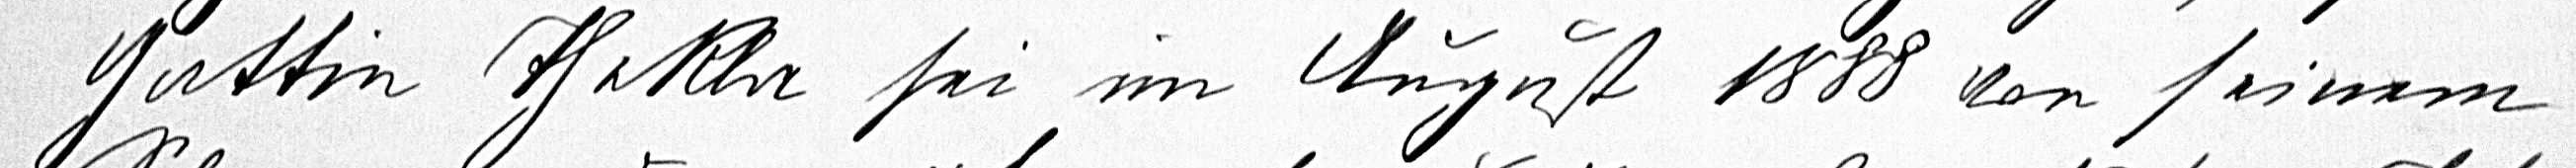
Gattin Thekla sei in August 1888 von seinem
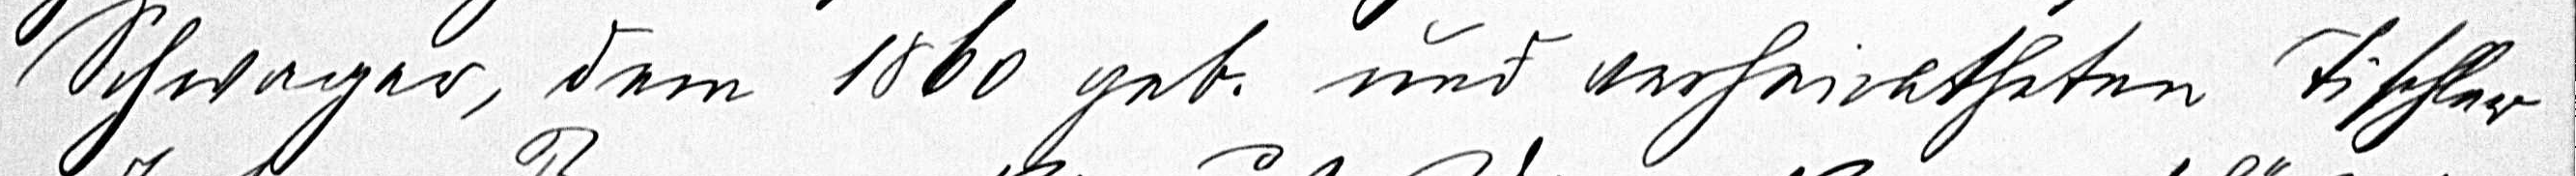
Schwager, dem 1860 geb. und verheiratheten Tischler
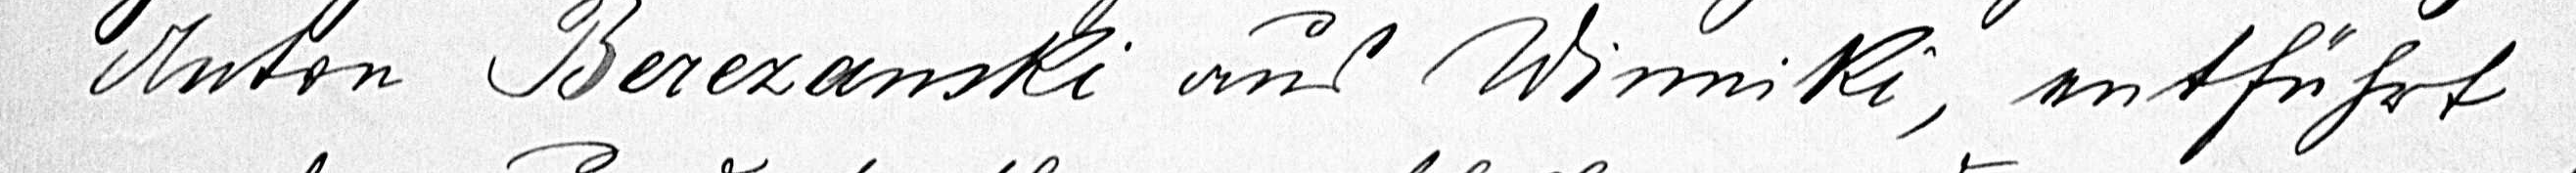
Anton Berezanski aus Winniki, entführt
